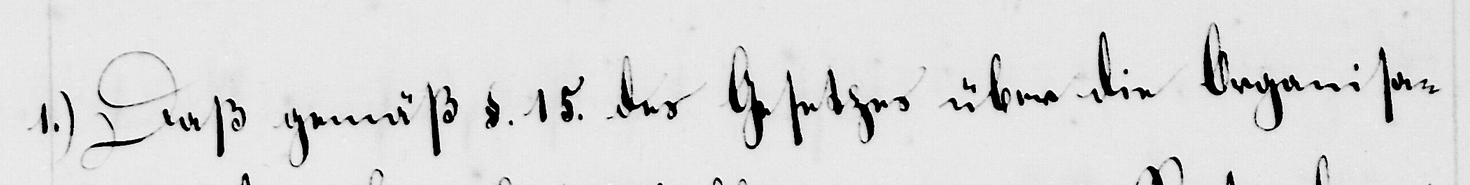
1.) Daß gemäß §. 15. des Gesetzes über die Organisa¬
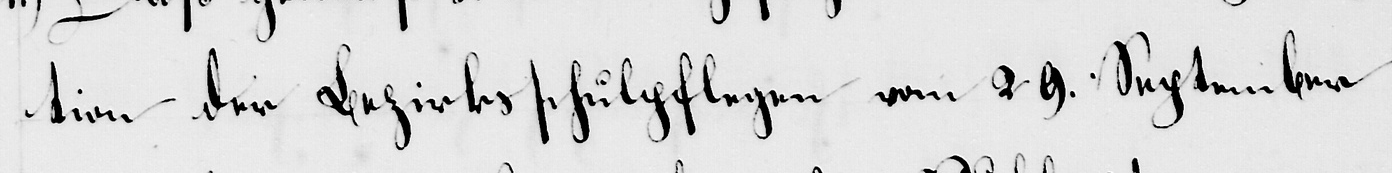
tion der Bezirksschulpflegen vom 29. September
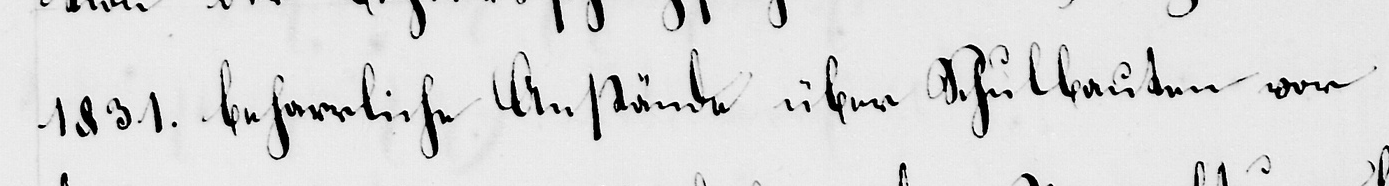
1831. beharrliche Anstände über Schulbauten vor
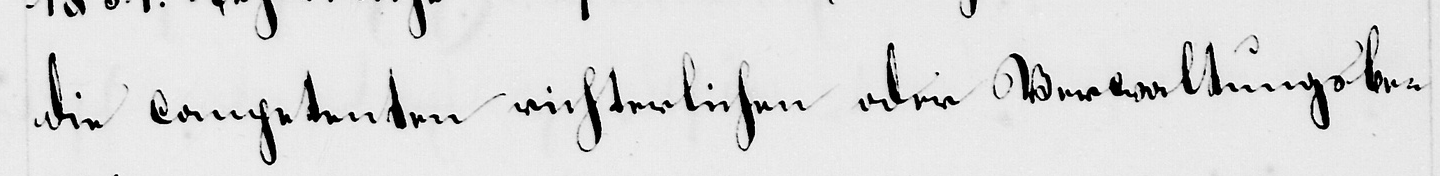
die competenten richterlichen oder Verwaltungsbe¬
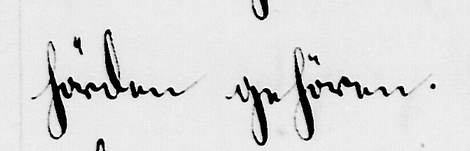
hörden gehören.
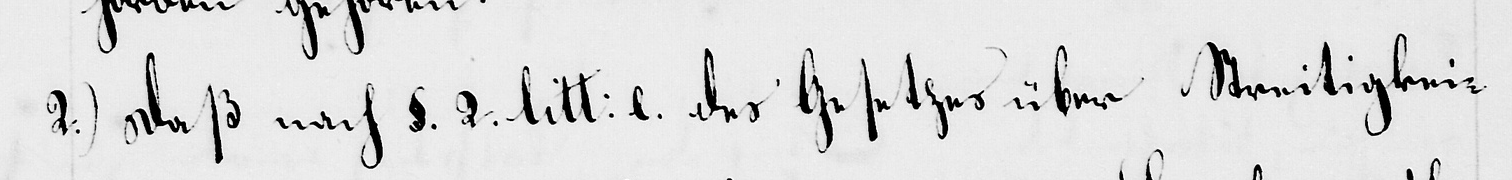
2.) Daß nach §. 2. litt: e. des Gesetzes über Streitigkei¬
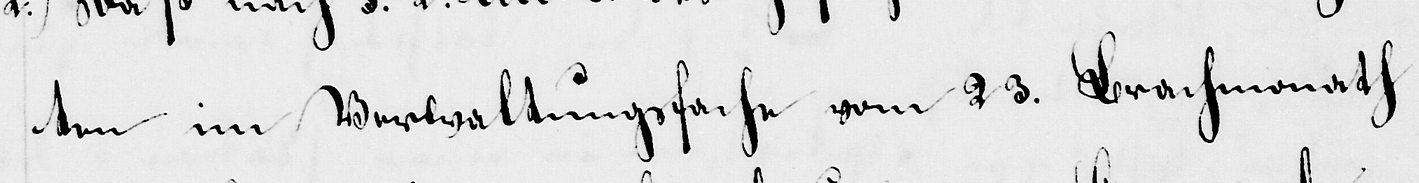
ten im Verwaltungsfache vom 23. Brachmonath
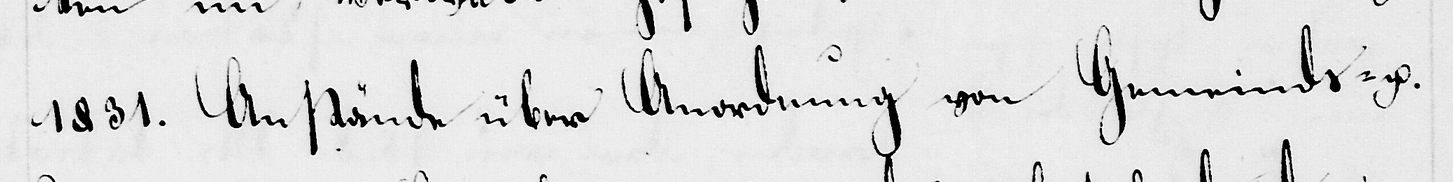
1831. Anstände über Anordnung von Gemeinds- u.
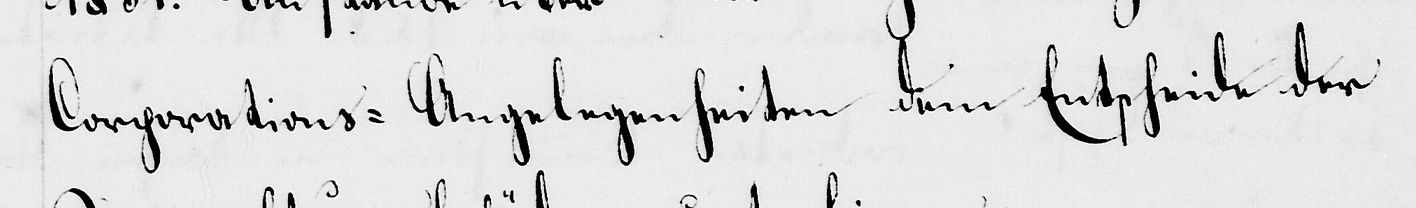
Corporations-Angelegenheiten dem Entscheide der
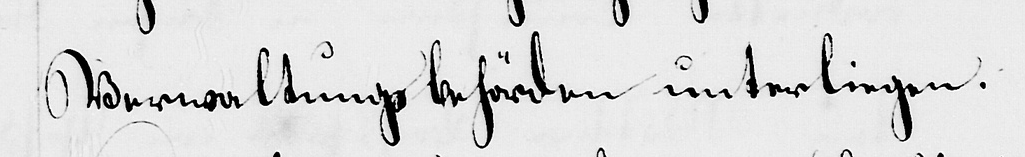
Verwaltungsbehörden unterliegen.
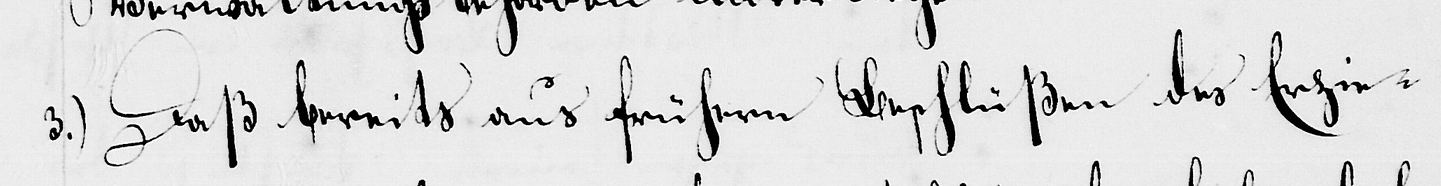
3.) Daß bereits aus frühern Beschlüßen des Erzie¬
